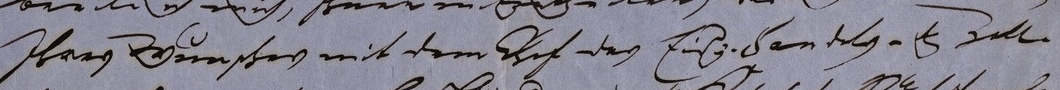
Ihres Wunsches mit dem Chef des Eidg. Handels- & Zoll-
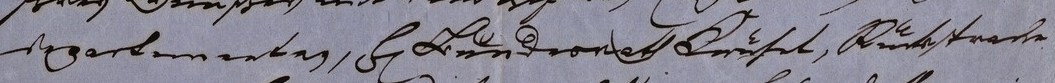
departementes, Herrn Bundesrath Knüsel, Rücksprache
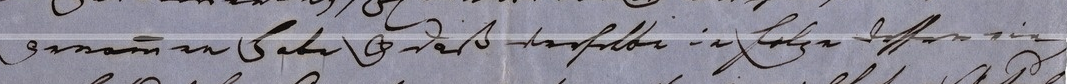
genommen habe & daß derselbe in Folge dessen ein
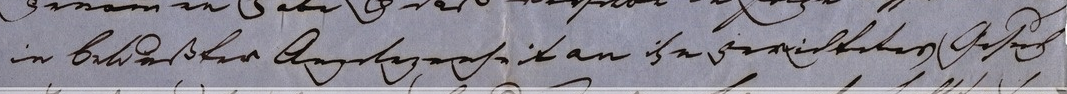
in bewußter Angelegenheit an ihn gerichtetes Gesuch
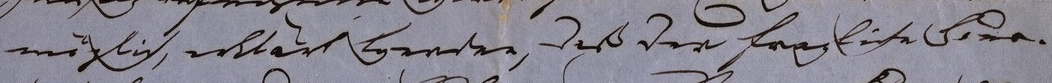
möglich, erklärt werden, daß der fragliche Haus-
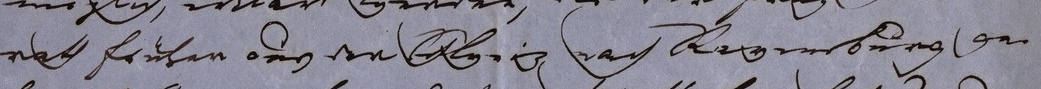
rath früher aus der Schweiz nach Ravensburg ge-
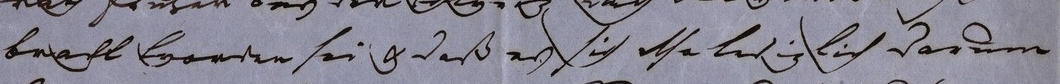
bracht worden sei & daß es sich also lediglich darum
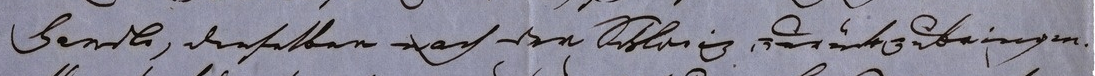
handle, denselben nach der Schweiz zurückzubringen.
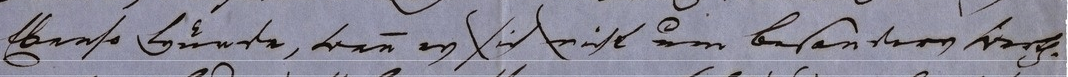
Ebenso würde, wenn es sich nicht um besonders werth-
